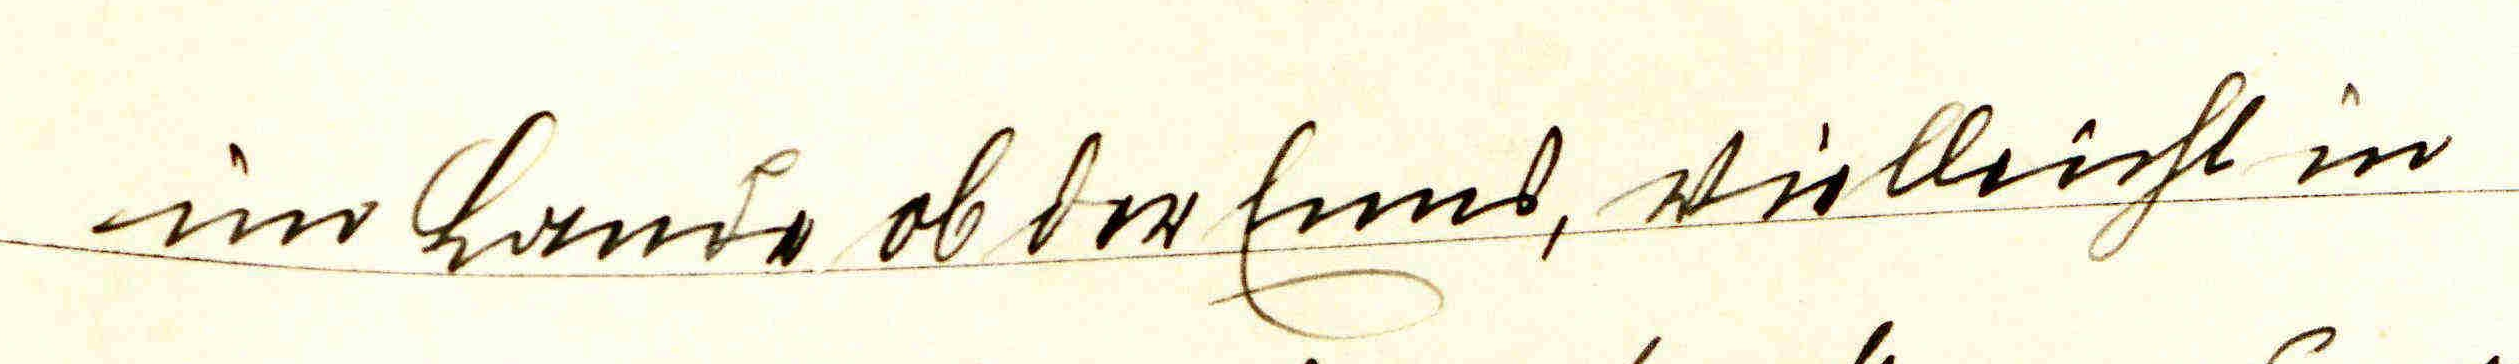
im Lande ob der Enns, vielleicht in
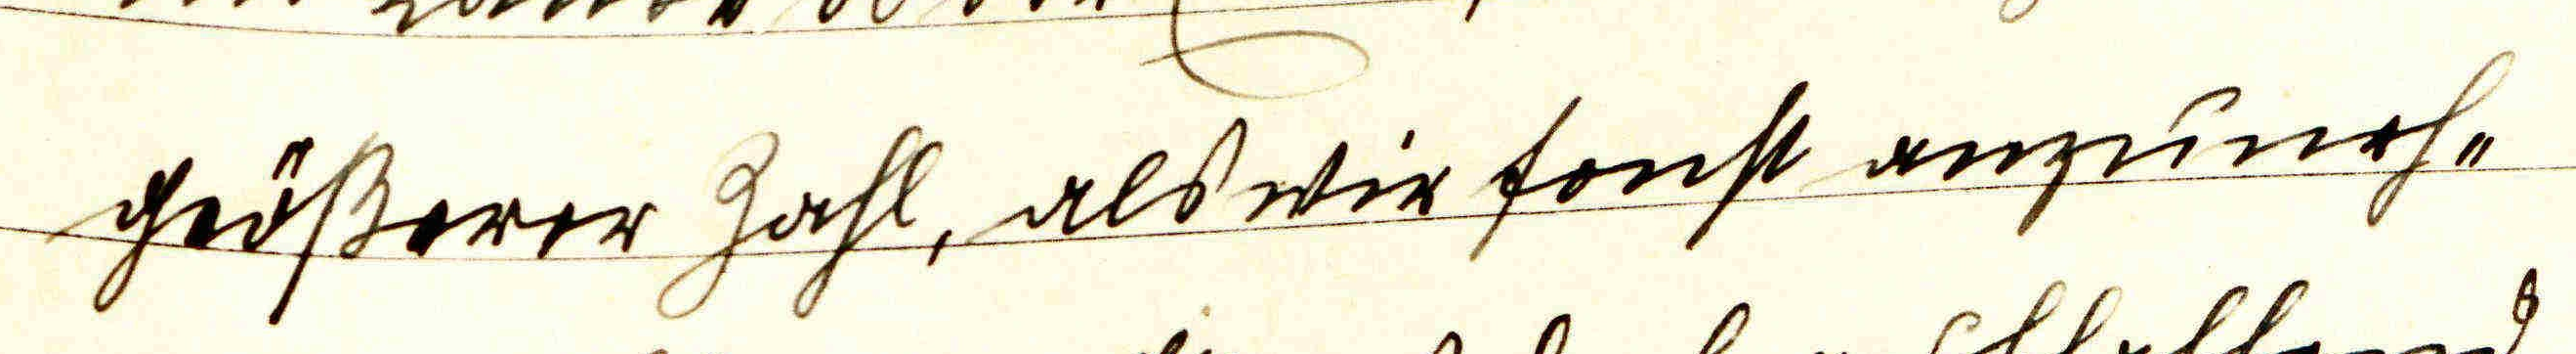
größerer Zahl, als wir sonst anzuneh-
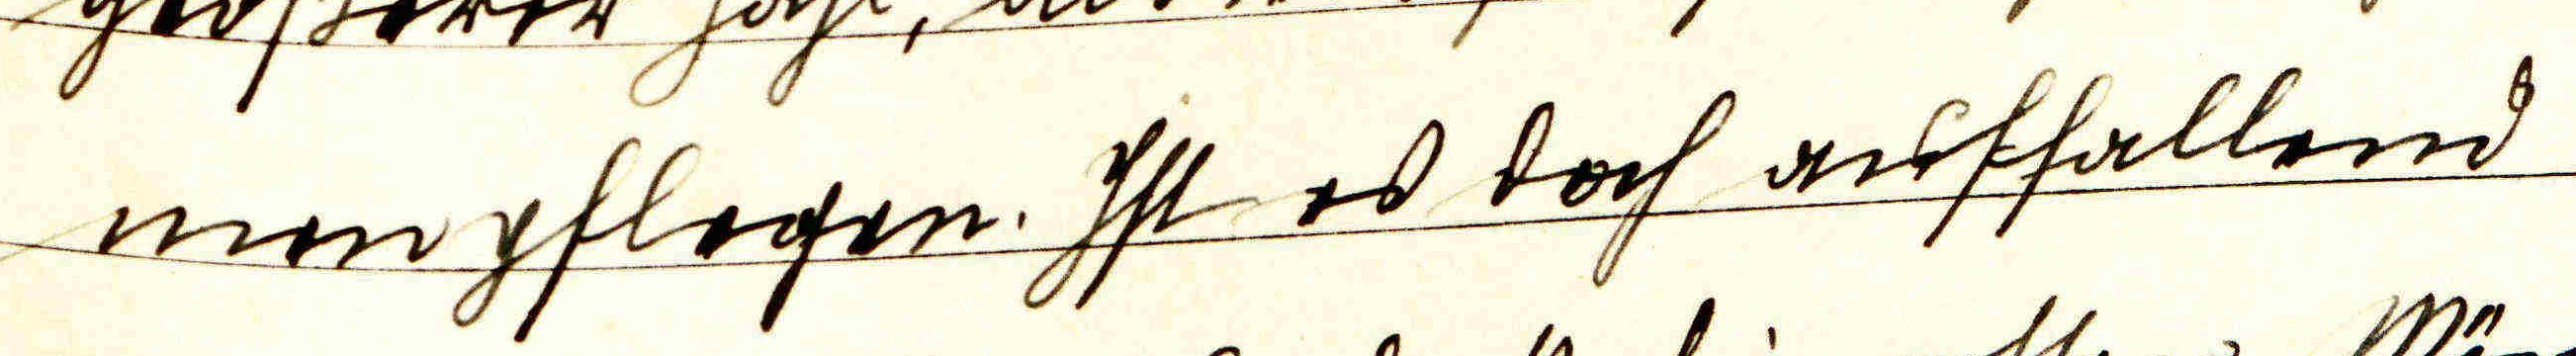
men pflegen. Ist es doch auffallend
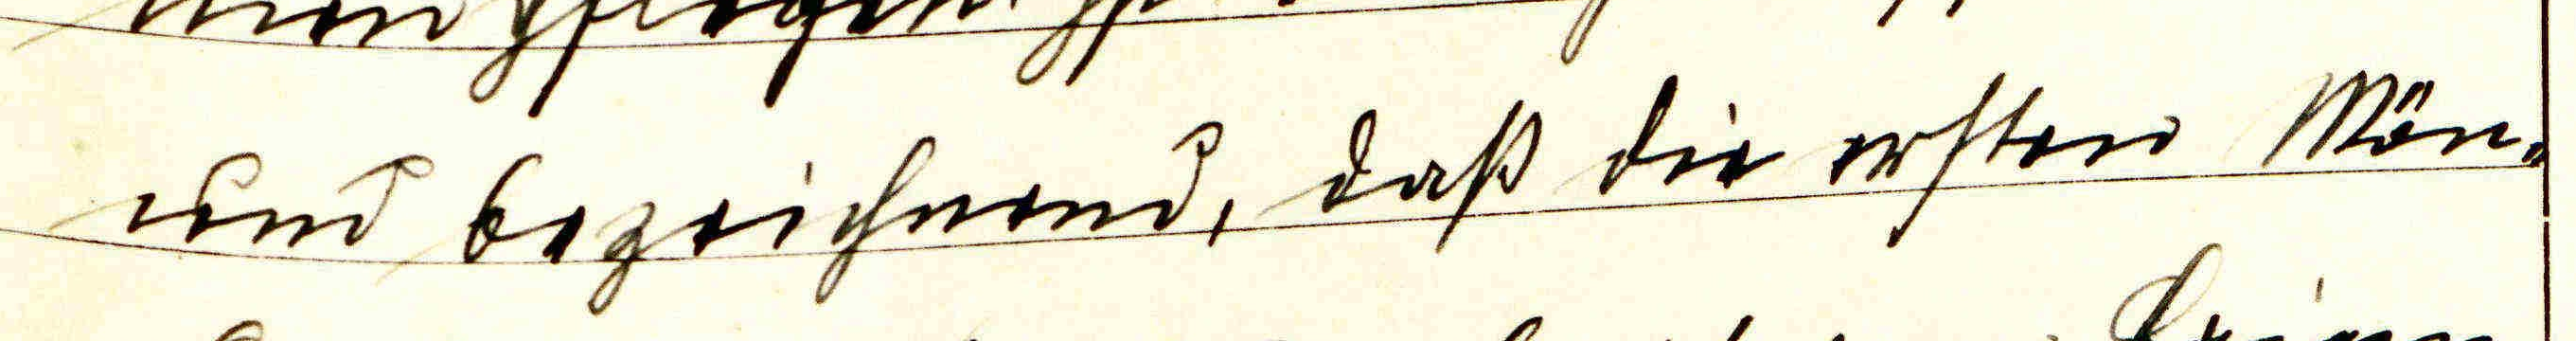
und bezeichnend, daß die ersten Mön-
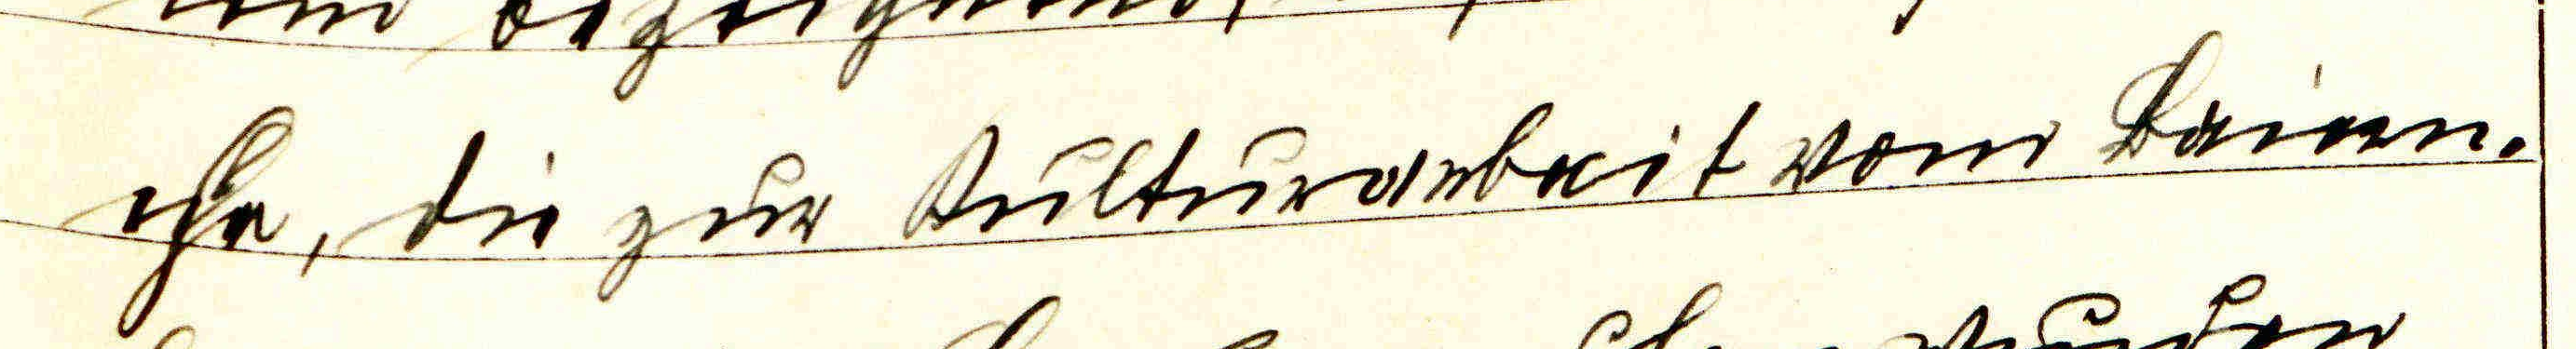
che, die zur Kulturarbeit vom Baiern
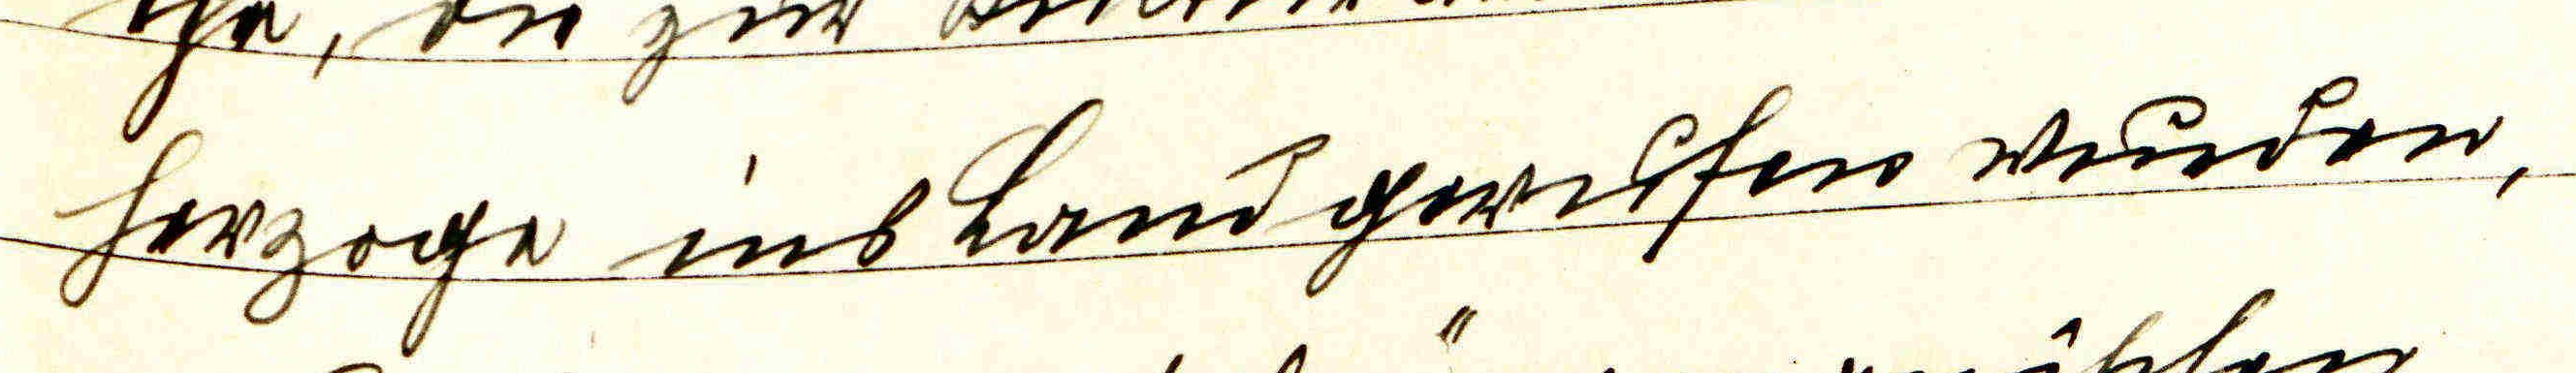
Herzoge ins Land gerufen wurden,
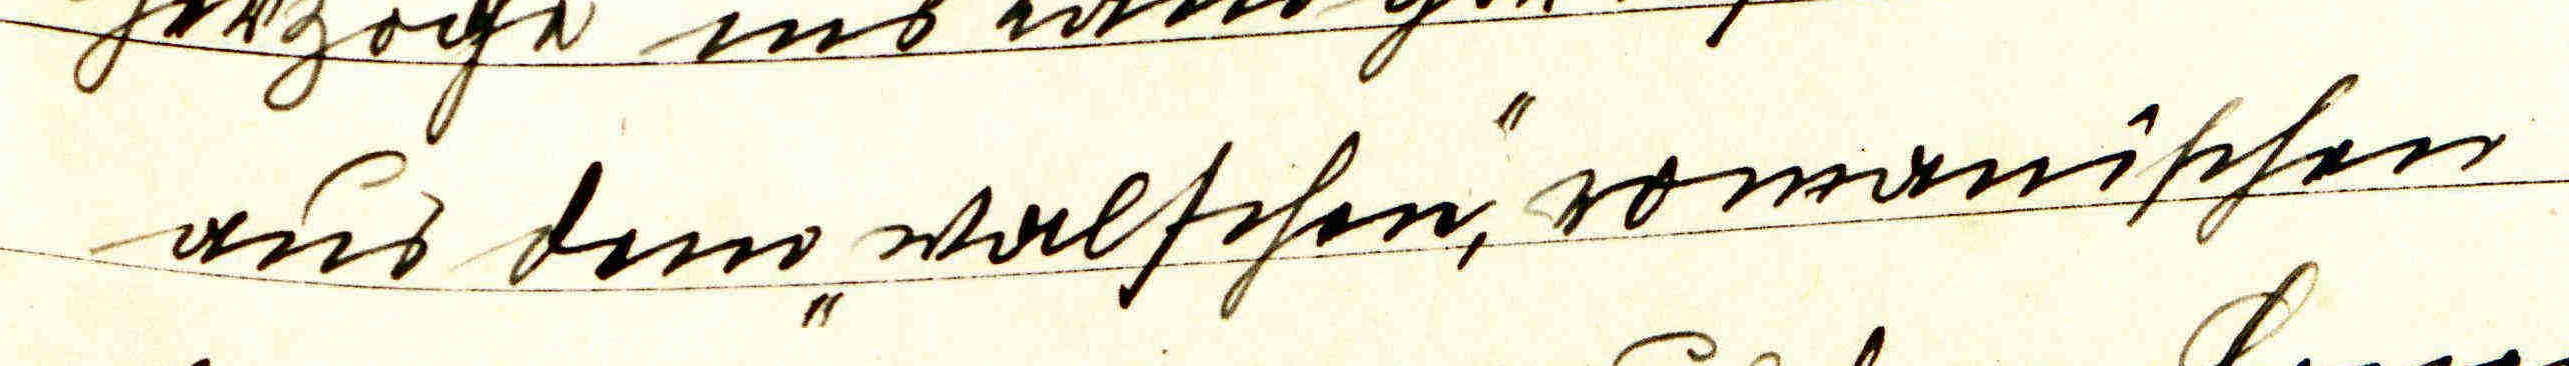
aus dem „walschen“, romanischen
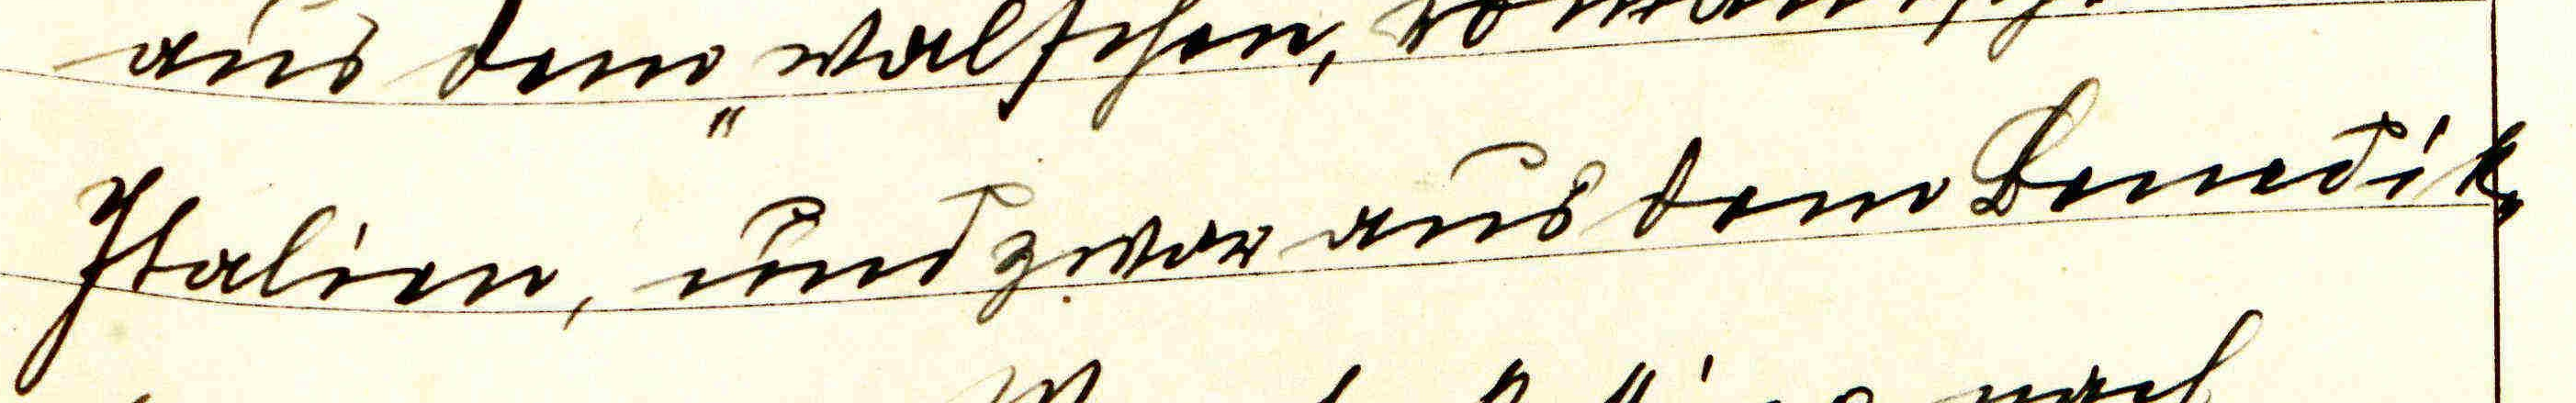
Italien, und zwar aus dem Benedik-
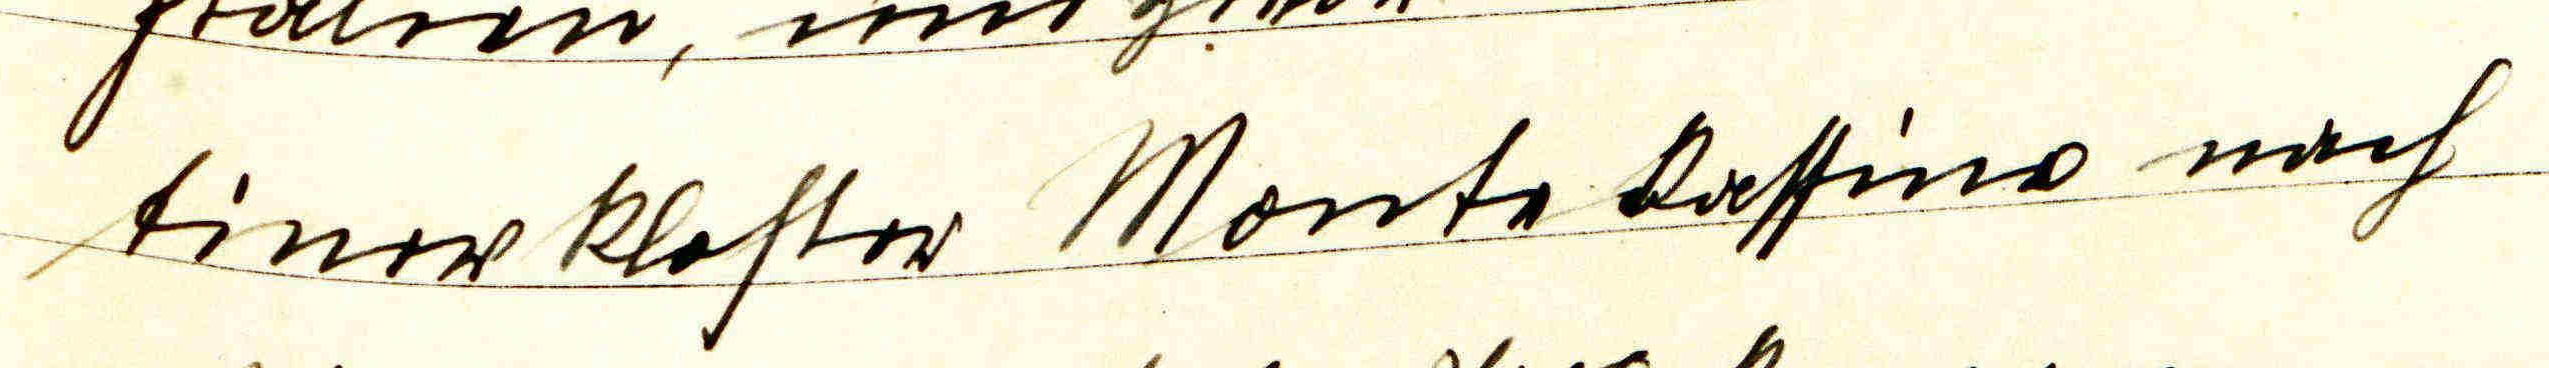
tiner Kloster Monte Kassino nach
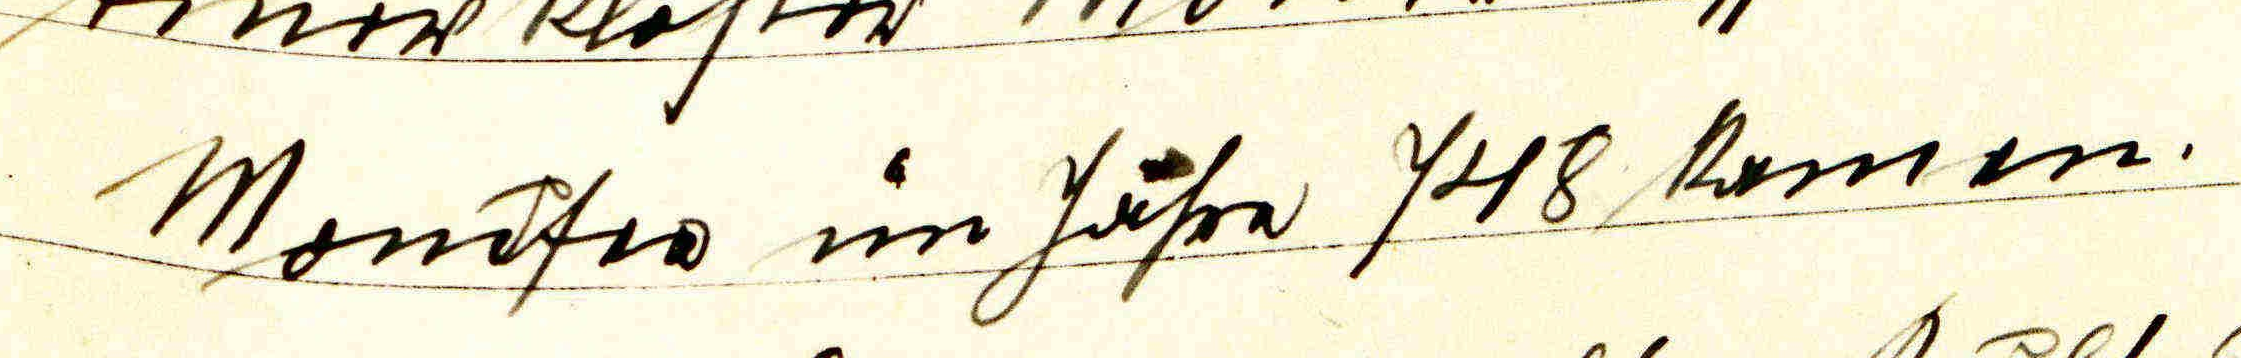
Mondsee im Jahre 748 kamen.
